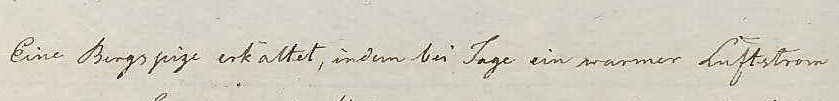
Eine Bergspize erkältet, indem bei Tage ein warmer Luftstrom
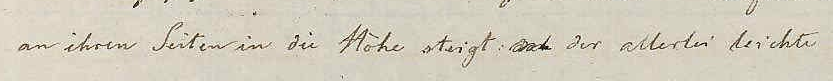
an ihren Seiten in die Höhe steigt: dah der allerlei leichte
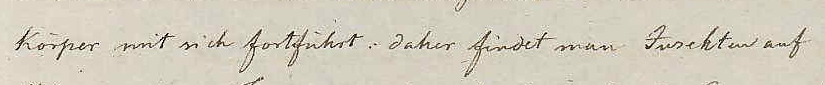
Körper mit sich fortführt: daher findet man Insekten auf
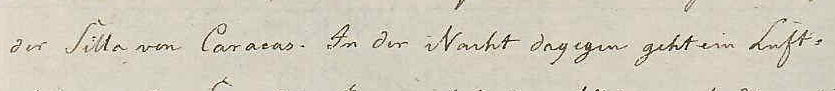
der Silla von Caracas. In der Nacht dagegen geht ein Luft-
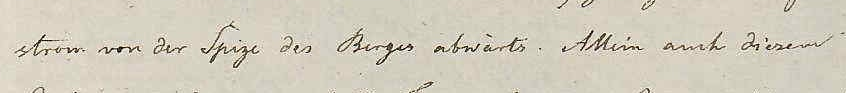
strom von der Spize des Berges abwärts. Allein auch diesem
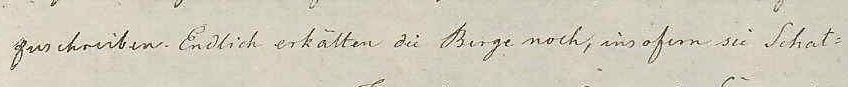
zuschreiben. Endlich erkälten die Berge noch, insofern sie Schat-
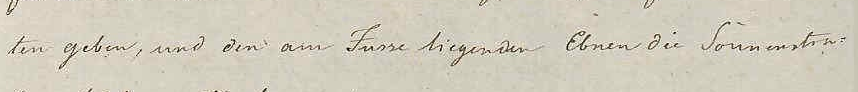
ten geben, und den am Fusse liegenden Ebnen die Sonnenstra-
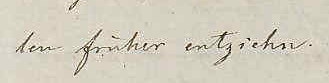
len früher entziehn.
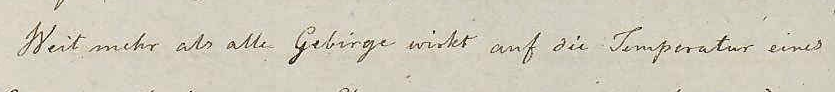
Weit mehr als alle Gebirge wirkt auf die Temperatur eines
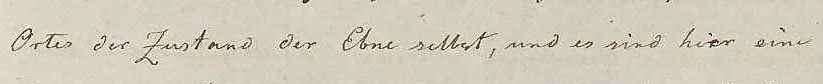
Ortes der Zustand der Ebne selbst, und es sind hier eine
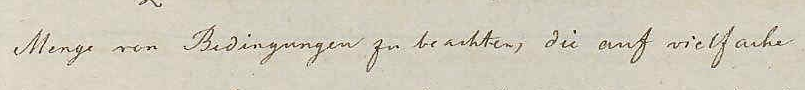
Menge von Bedingungen zu beachten, die auf vielfache
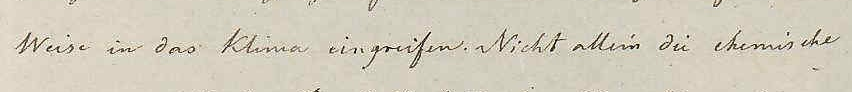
Weise in das Klima eingreifen. Nicht allein die chemische
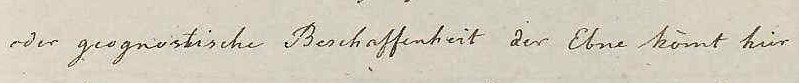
oder geognostische Beschaffenheit der Ebne kömt hier
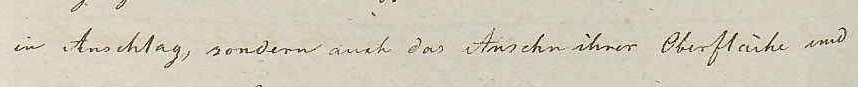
in Anschlag, sondern auch das Ansehn ihrer Oberfläche und
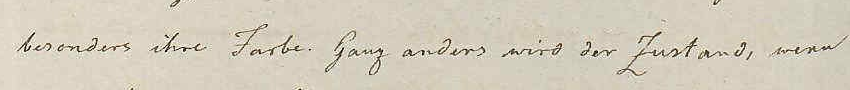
besonders ihre Farbe. Ganz anders wird der Zustand, wenn
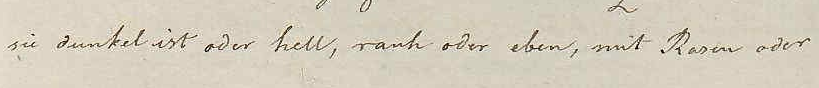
sie dunkel ist oder hell, rauh oder eben, mit Rasen oder
